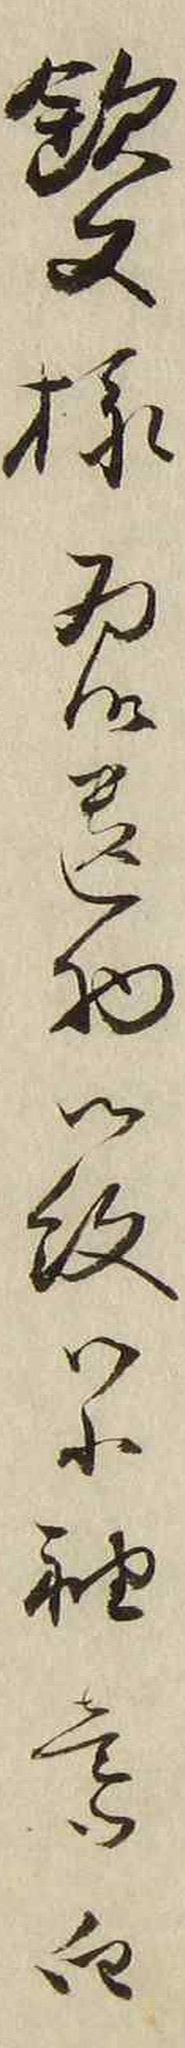欽文様為御遺物御紋小袖壱つ白

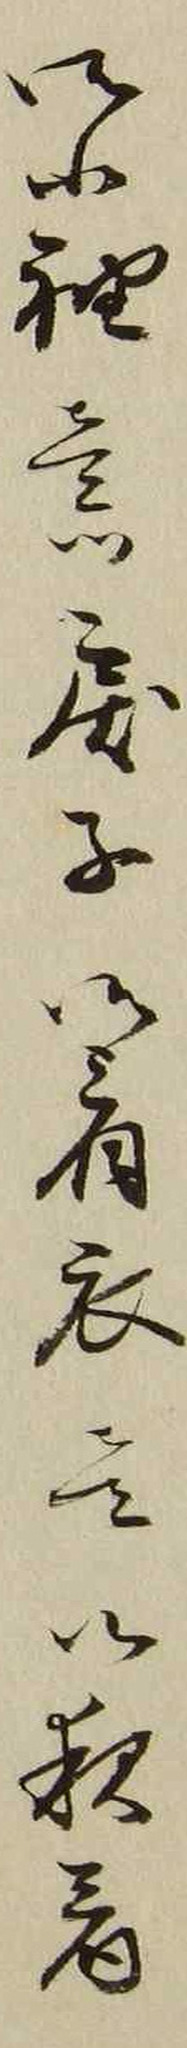御小袖壱つ戻子御肩衣壱御夜着
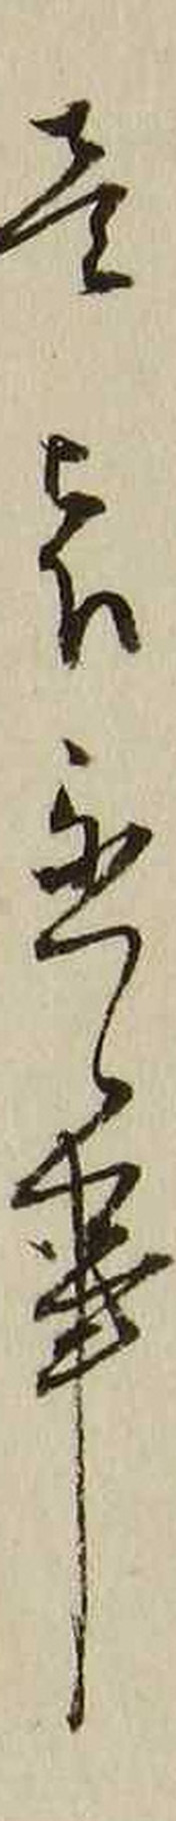壱被下置候事
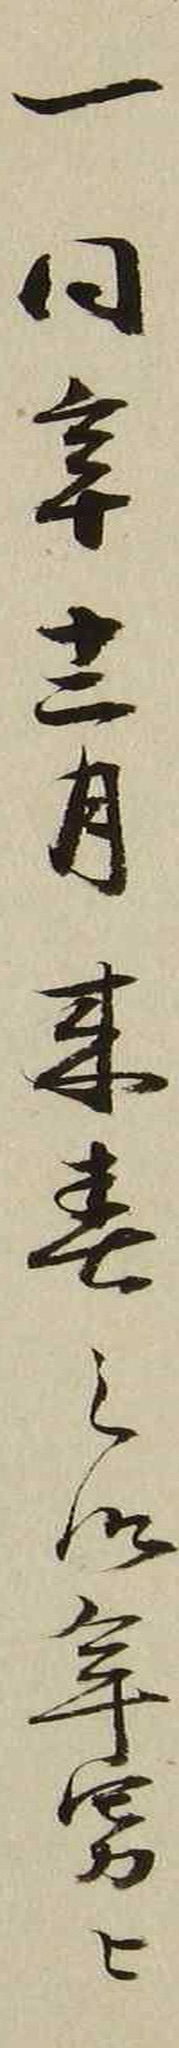一同年十二月来春之御年男被
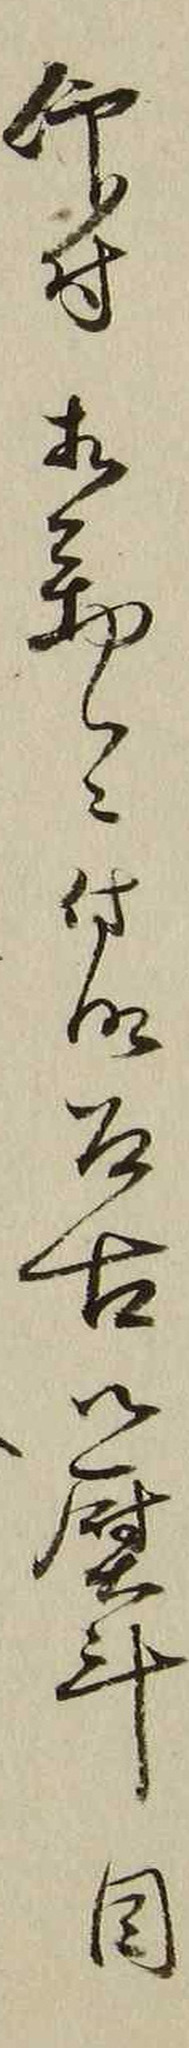仰付相勤候に付御召御古御熨斗目
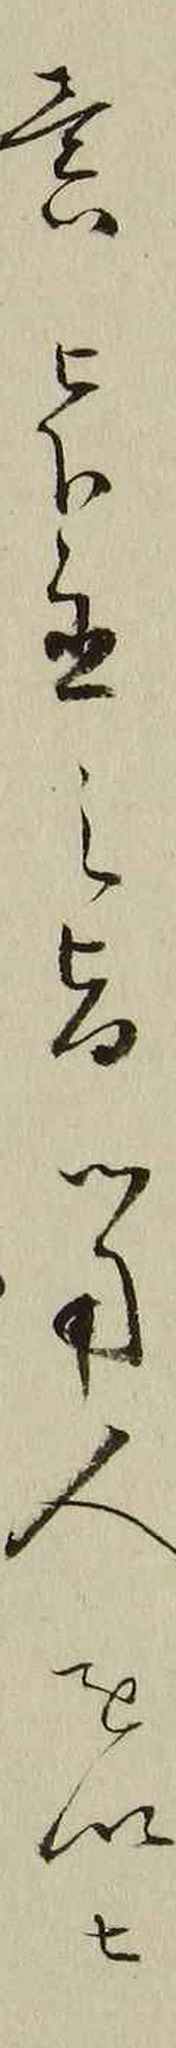壱つ被下置之旨御用人を以被
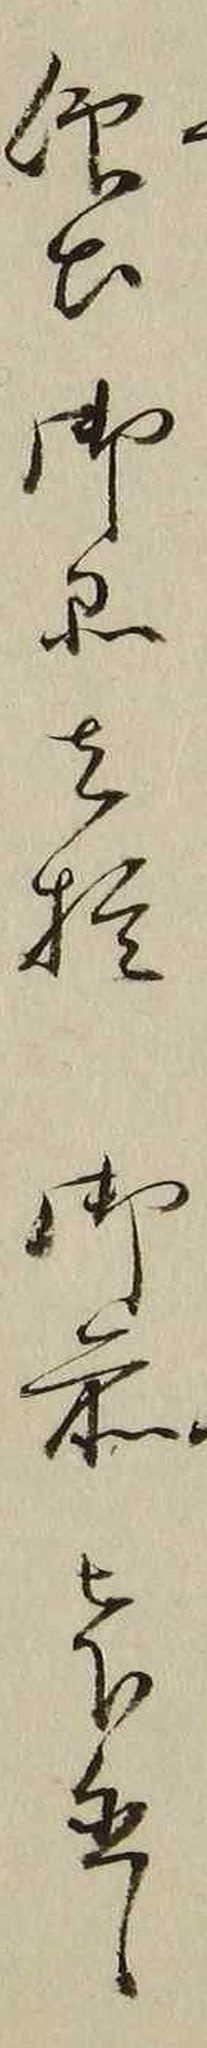仰出御品は於御前被下置候
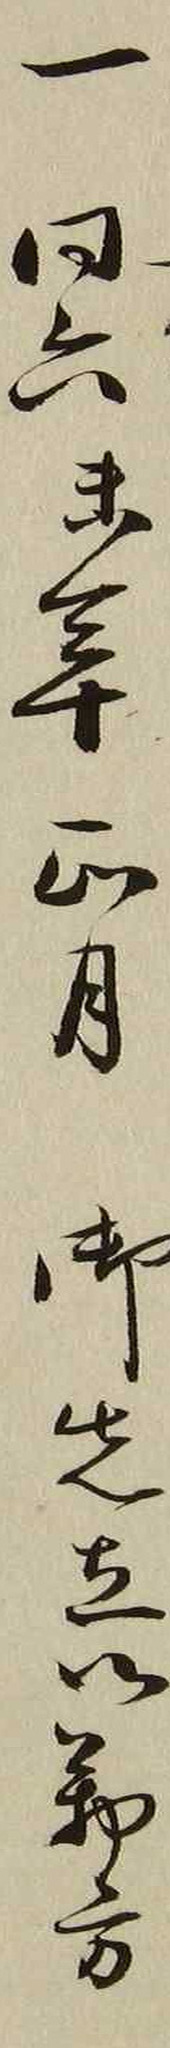一同六未年正月御先立御勤方
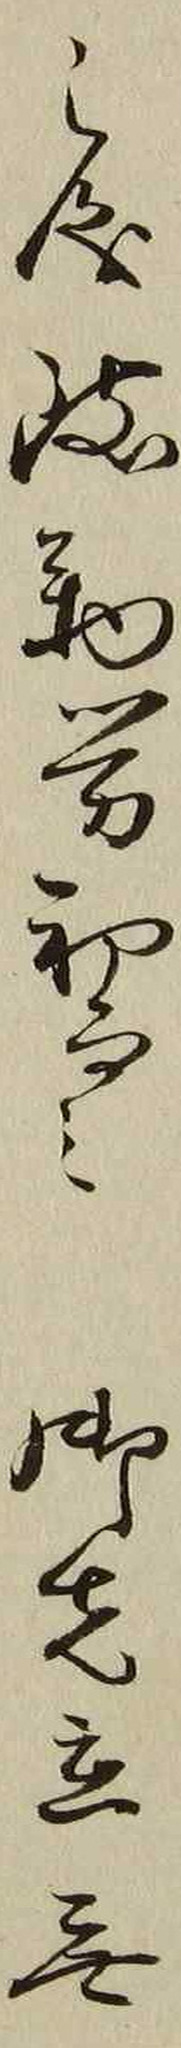之儀致勤労初而之御先立無
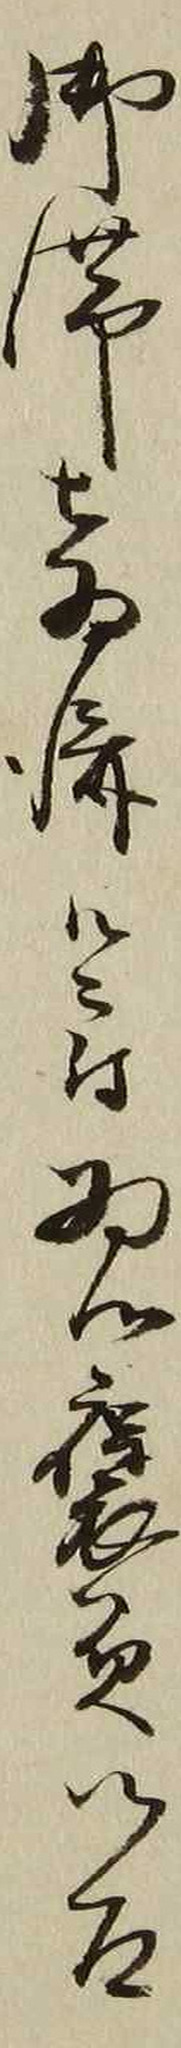御滞被為済候に付為御褒美御召
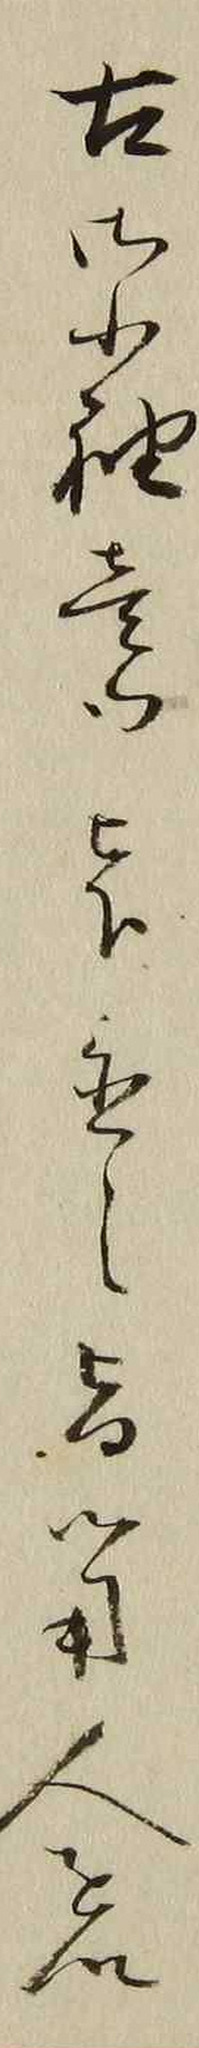古御小袖壱つ被下置之旨御用人を以
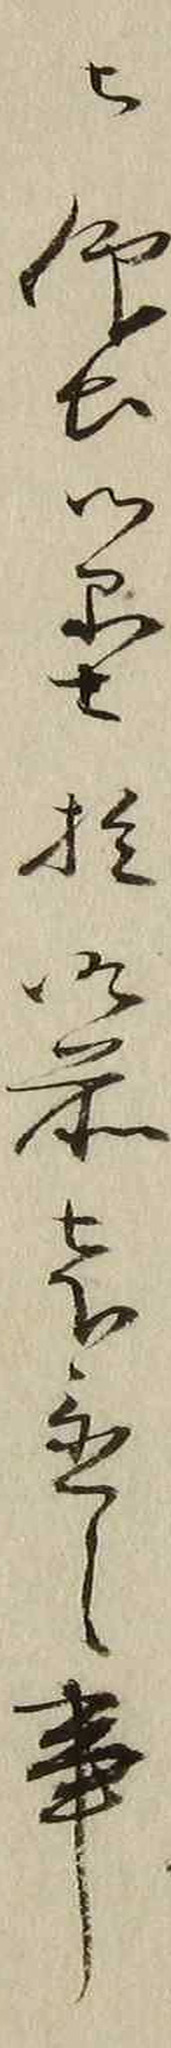被仰出御品は於御前被下置候事
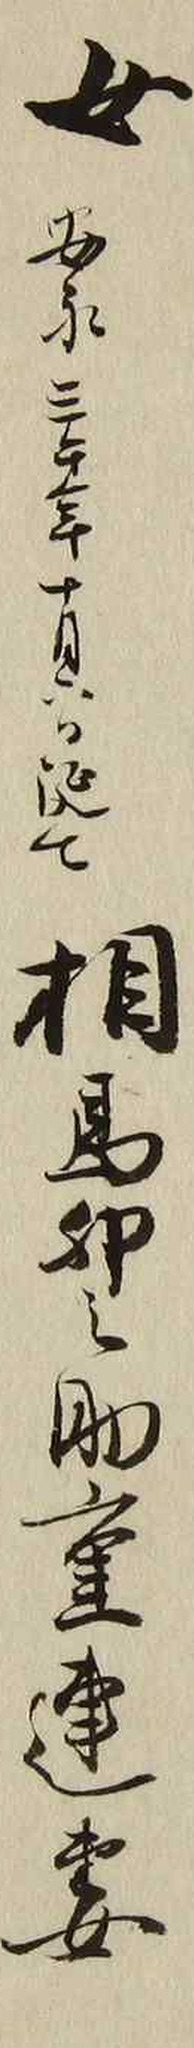女安永三午年十月六日誕生相馬卯之助重連妻
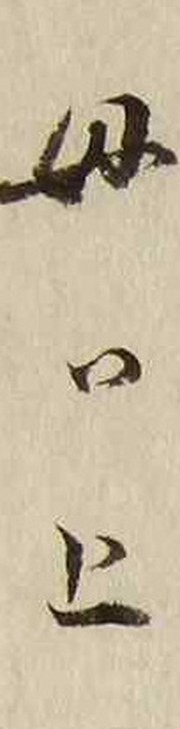母同上
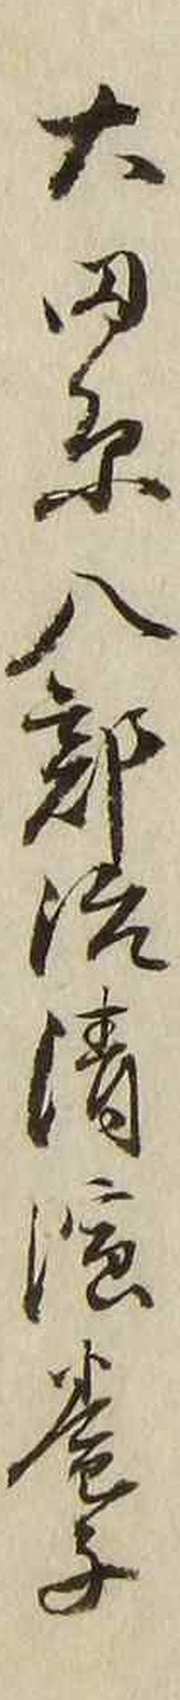大田原八郎治清演養子

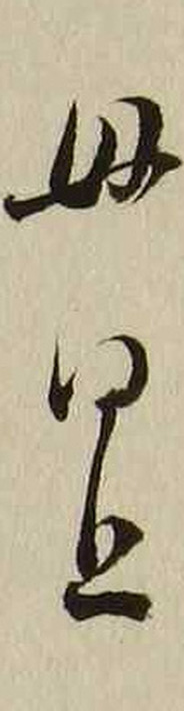母同上
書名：諸士系譜　巻之292　き之部1
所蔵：会津若松市立会津図書館
